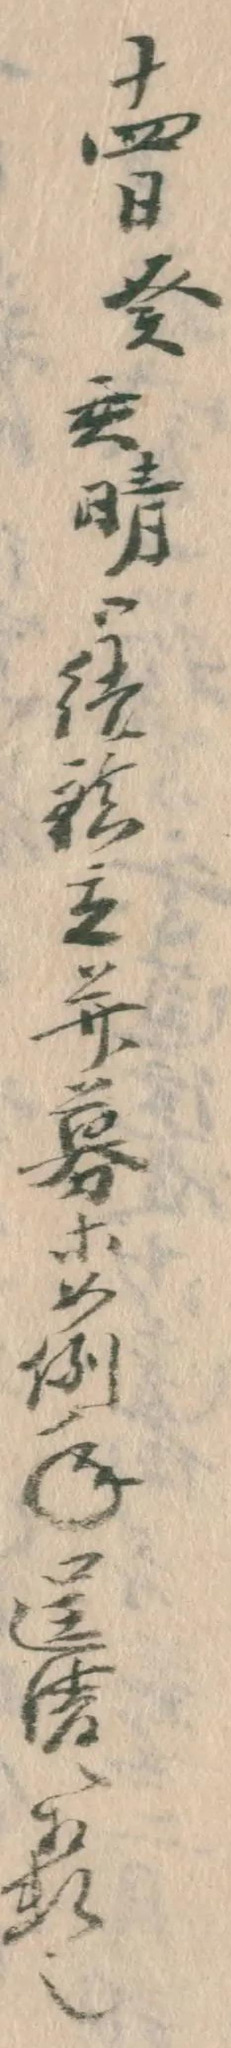十四日癸亥晴御結鎮立幷募等如例年逞清へ相頼也
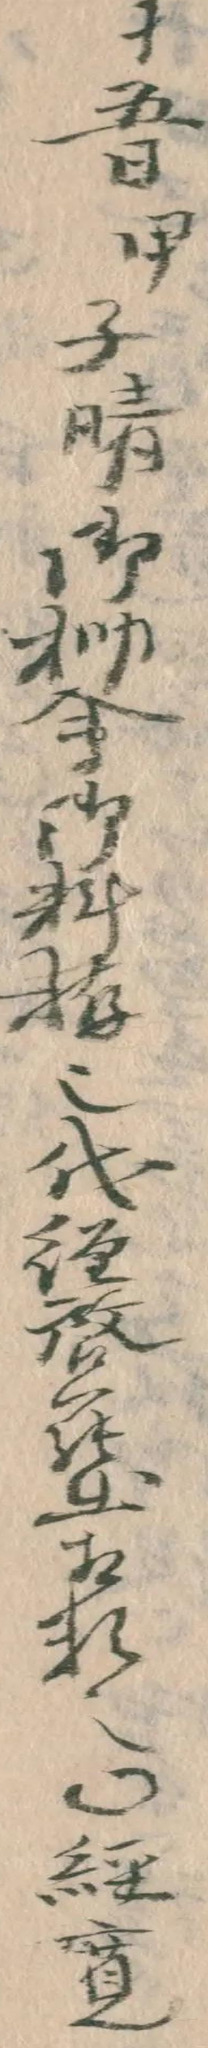十五日甲子晴御棚會御料拵也代経啓罷出相頼之○経寛
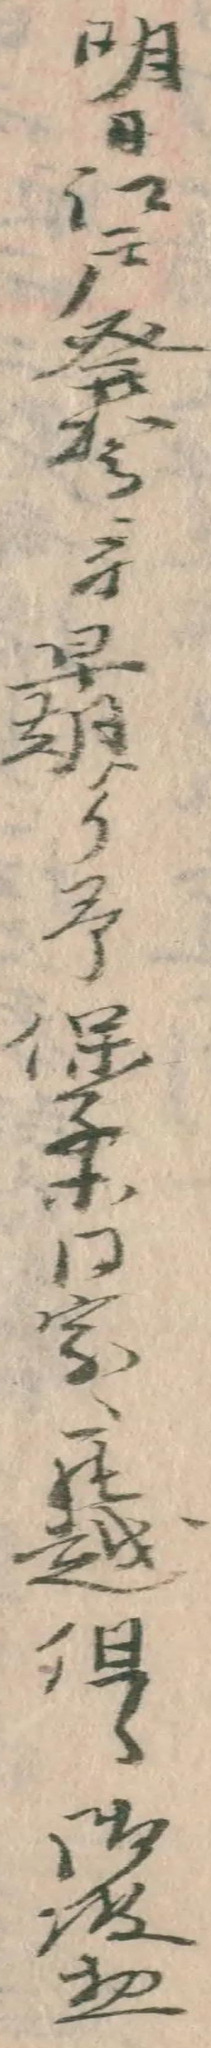明日江戸発駕ニ付早朝より予保子等同家へ罷越但し御渡惣
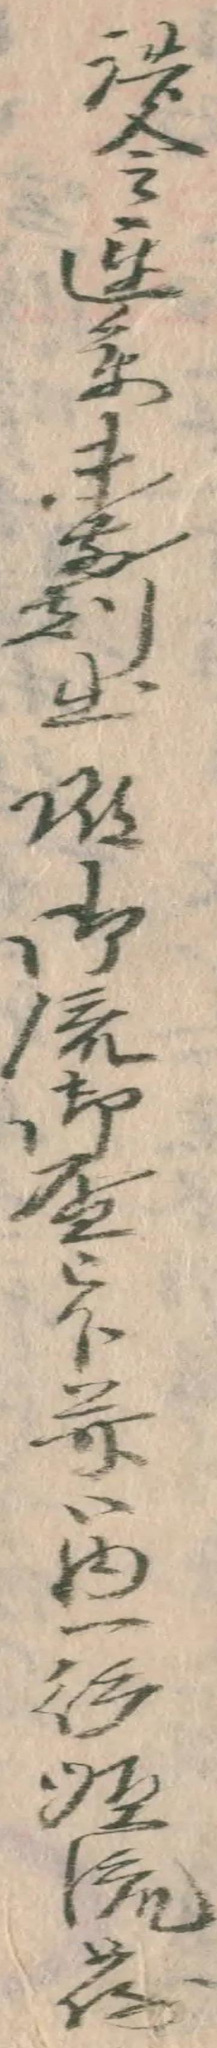詰令遅参未前刻出殿御流御盃被下并御内一統順流如例
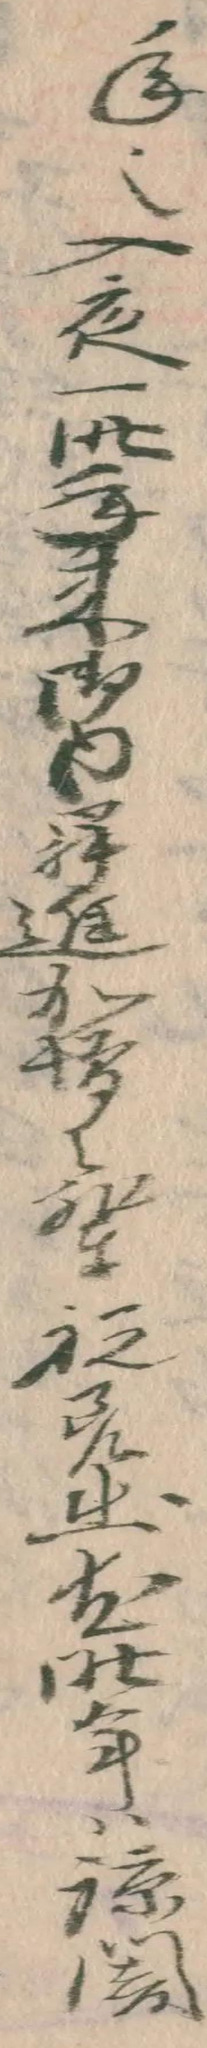年也入夜一昨年来御内昇進加増之輩祝差出尤昨年ハ諒闇
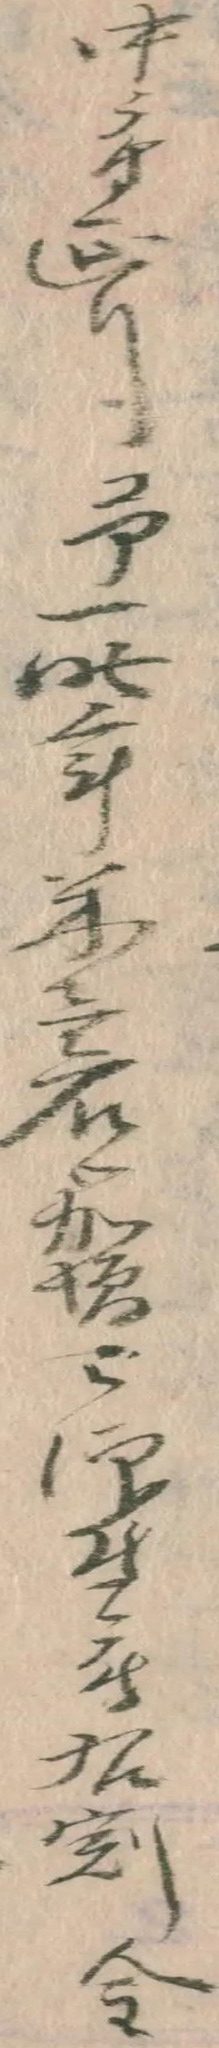中ニ付延引予一昨年米壱石御加増被仰付ニ付右割金
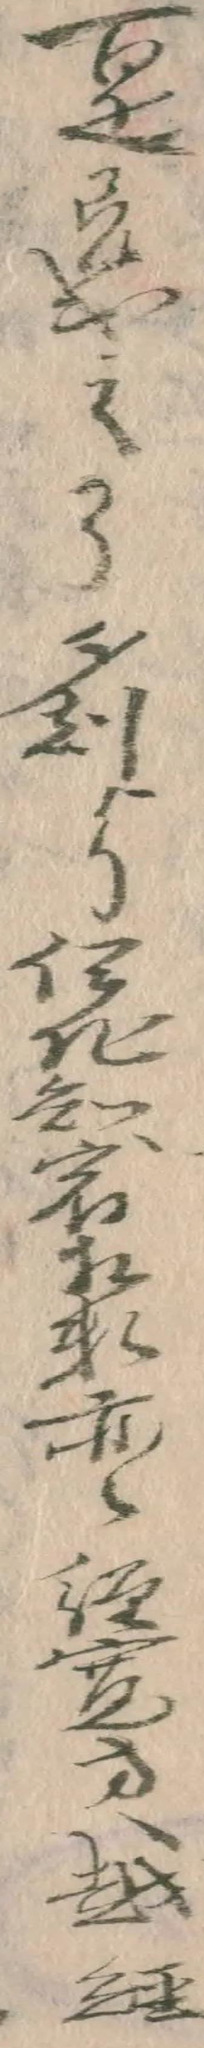百疋差出之了夕刻より伊地知宿相頼亦々経寛方へ越経
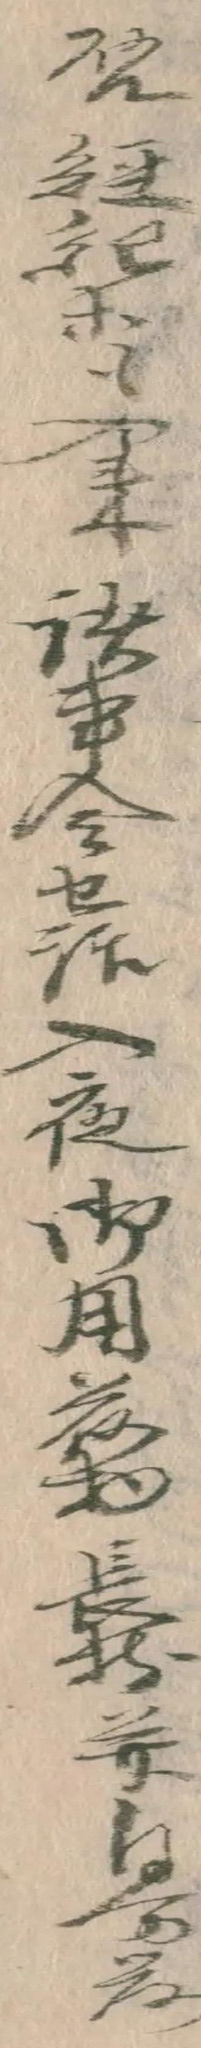啓経記等も入来諸事令世話入夜御用荷物長持并自分落
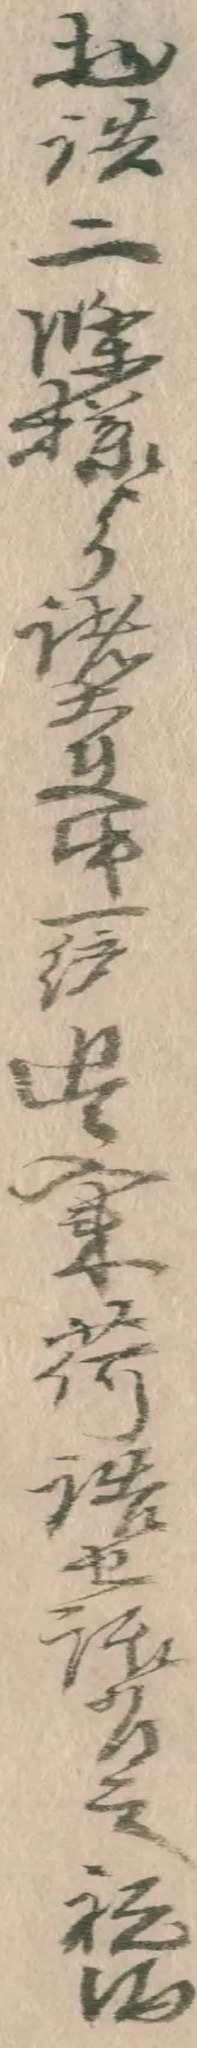物語二條様より諸大夫中一統追々入来荷詰世話有之祝酒
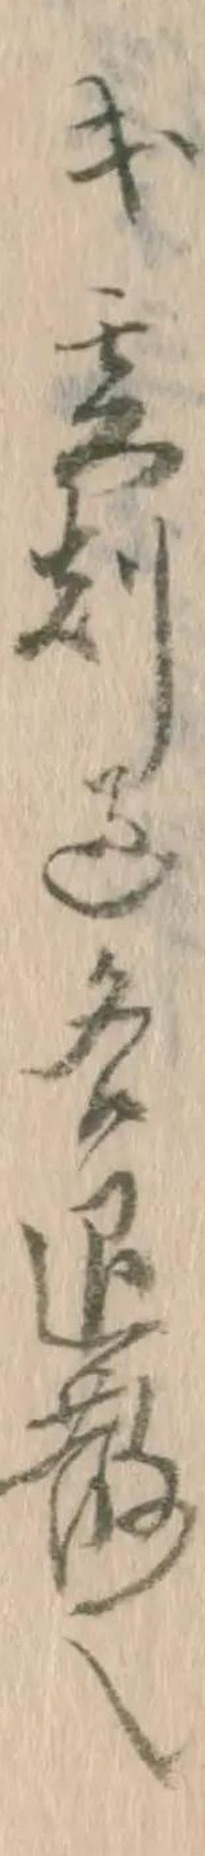出亥刻過各退散也
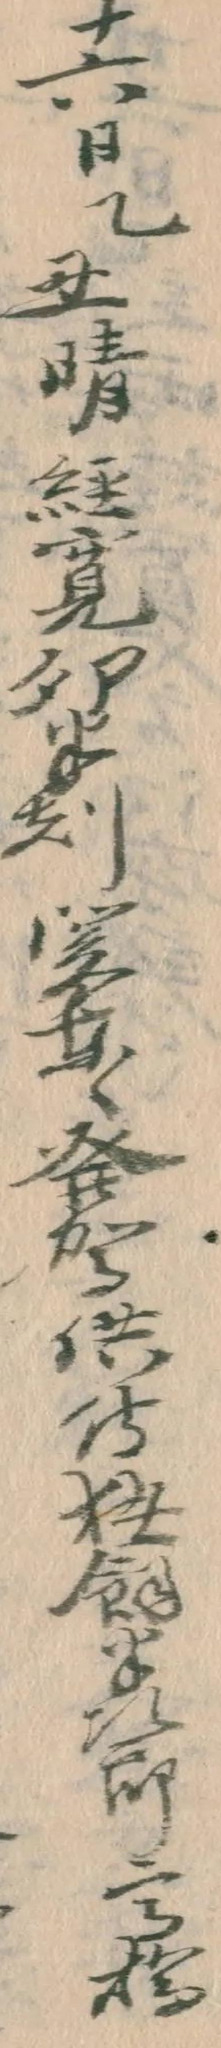十六日乙丑晴経寛卯半刻関東へ発駕供侍猪飼半次郎高橋
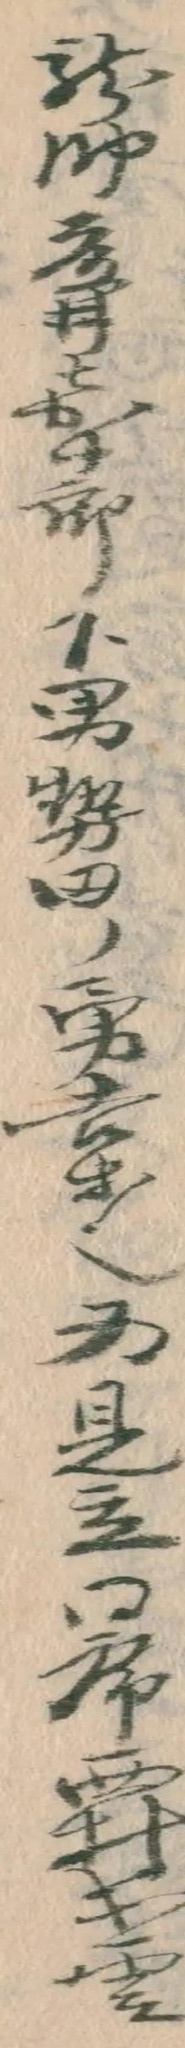龍助藤井嘉十郎下男勢田ノ勇吉等也為見立同席西村出雲
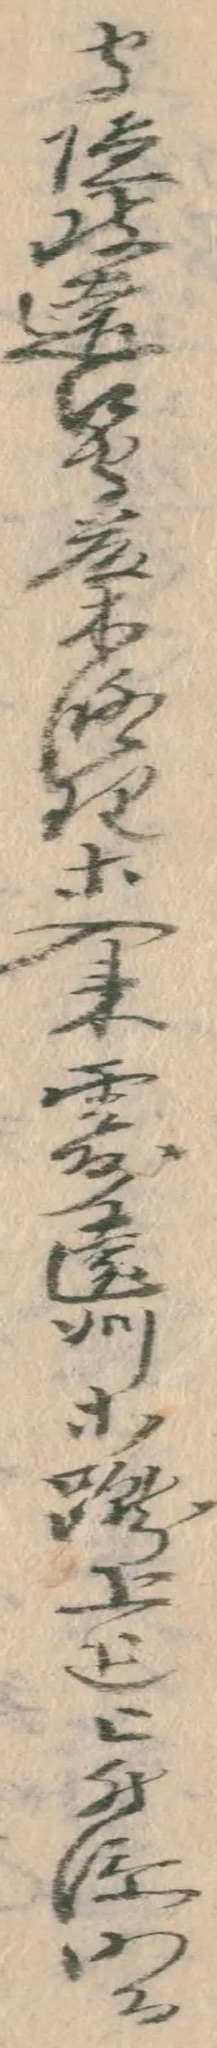守隠岐遠江守藤木修理等入来霊前遠州等蹴上迄被付添仍而
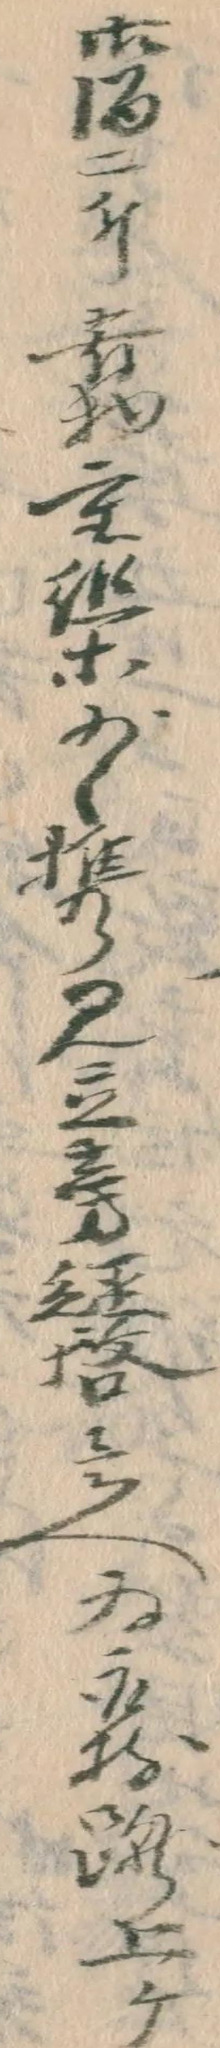御酒二升肴物重組等少々携見立旁経啓壱人為所持蹴上ケ
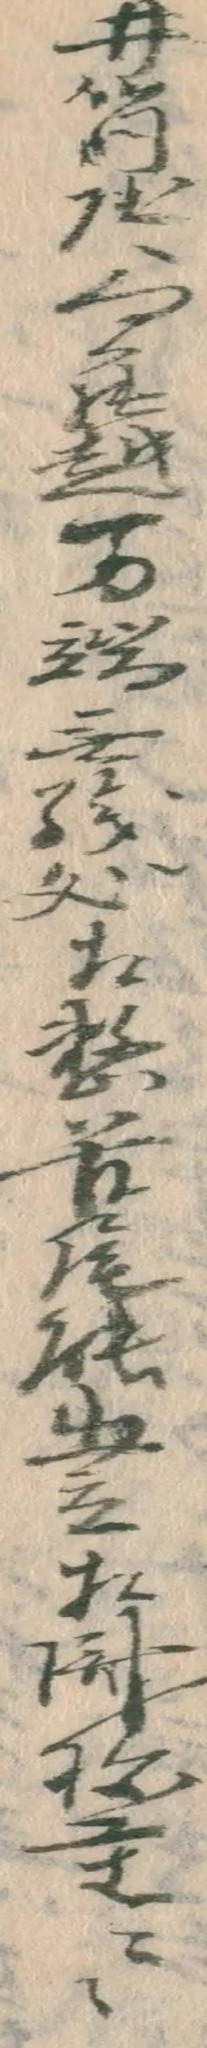井筒屋へ向罷越万端無残処相整首尾能出立相済弥重々々
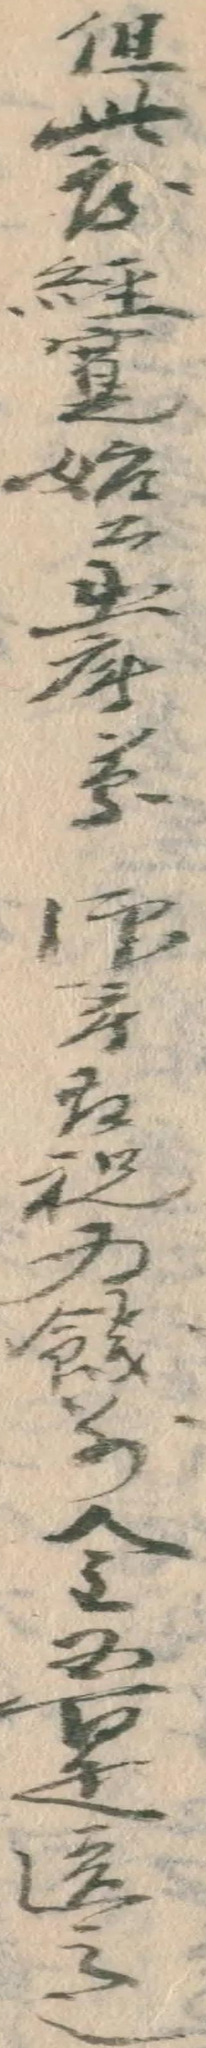但此度経寛始而出府蒙仰ニ月御祝為饑別金五百疋送之也
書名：賀茂社記録. 第69冊
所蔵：国立国会図書館 National Diet Library, JAPAN
